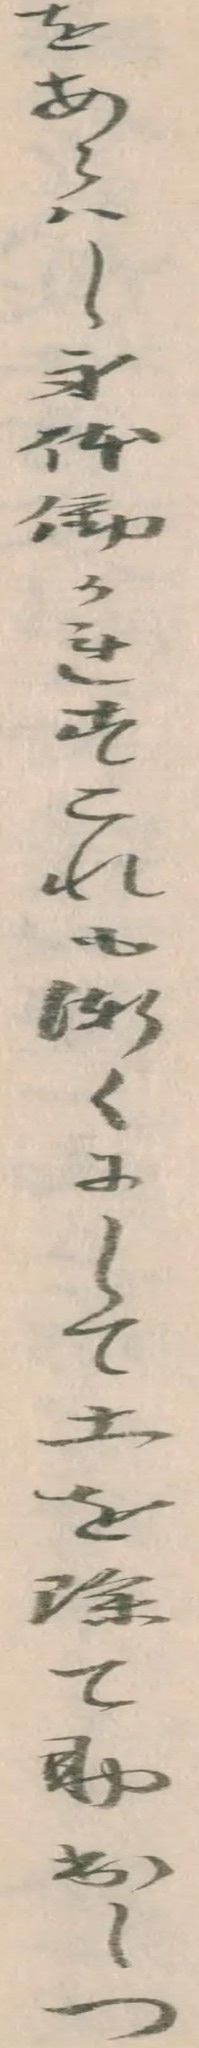をあらはし身体働かれすこれも漸くにして土を除て助出しつ
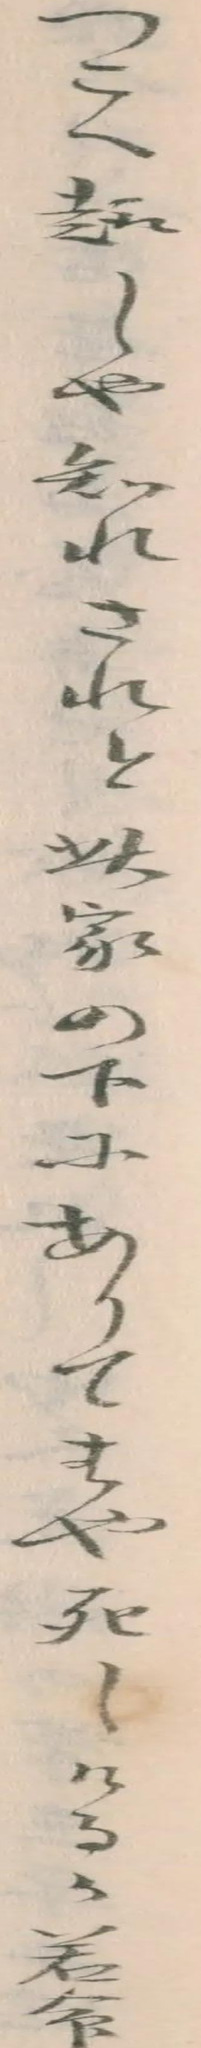つこへ趣しや知れされと此家の下にありてはや死しけるか若命
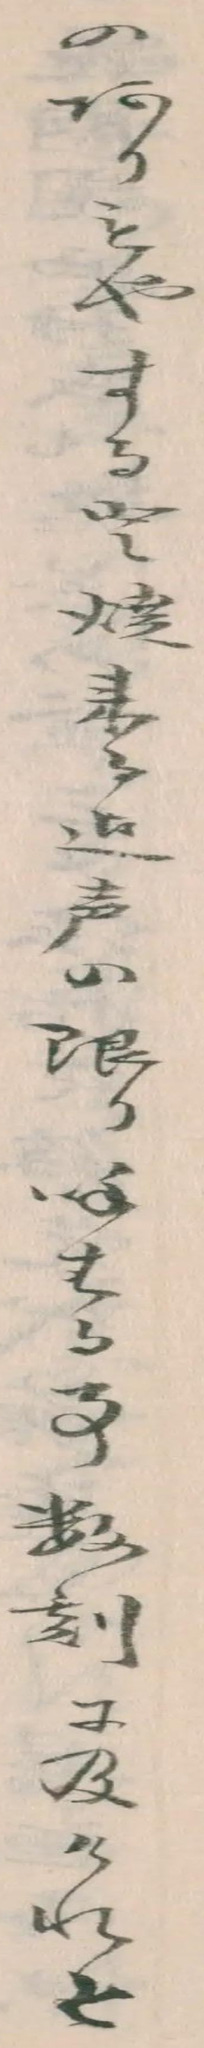のありもやすると焼来る迄声の限り呼はる事数刻に及けれと
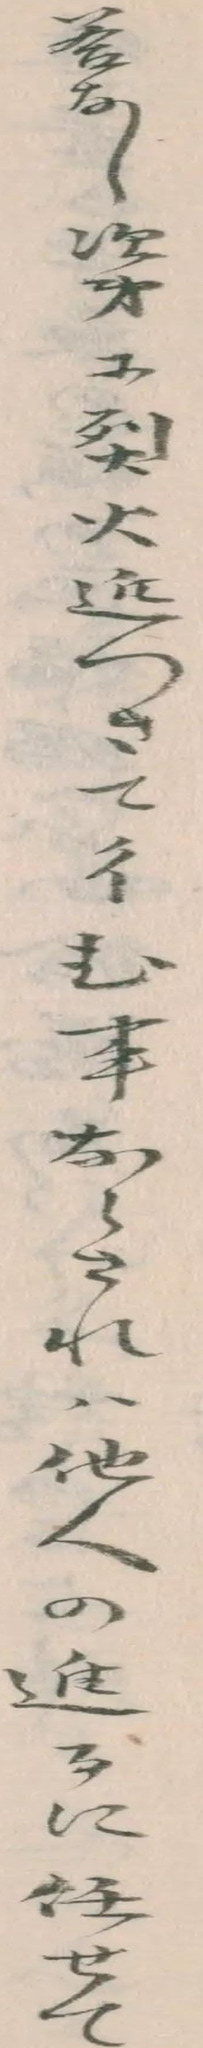答なし次第に烈火近つきて彳む事ならされは他人の進るに任せて
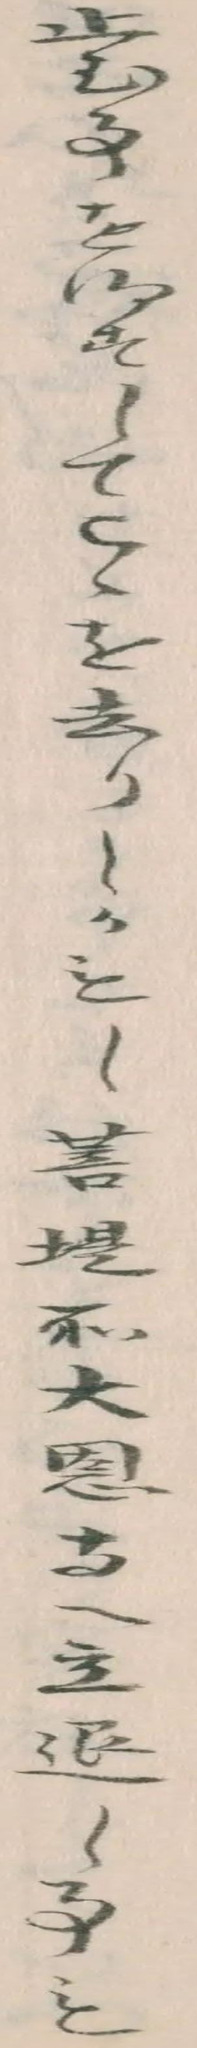止む事を得すしてこゝを去りしかもし菩提所大恩寺へ立退し事も
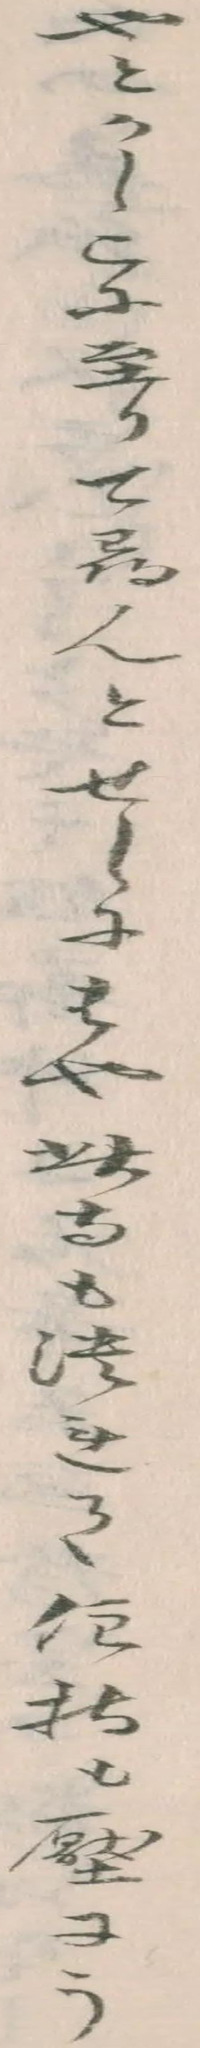やとかしこに至りて尋ねんとせしにはや此寺も潰れて住持も圧にう
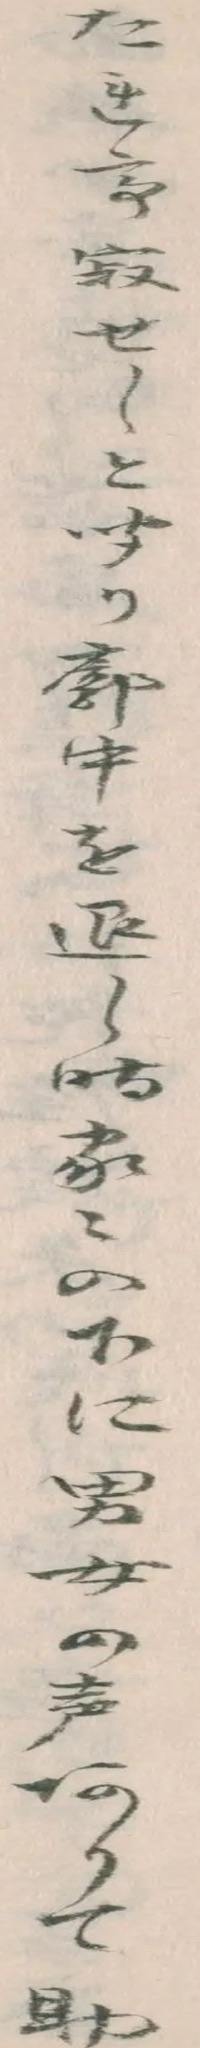たれて寂せしと聞り廓中を退し時家々の下に男女の声ありて助
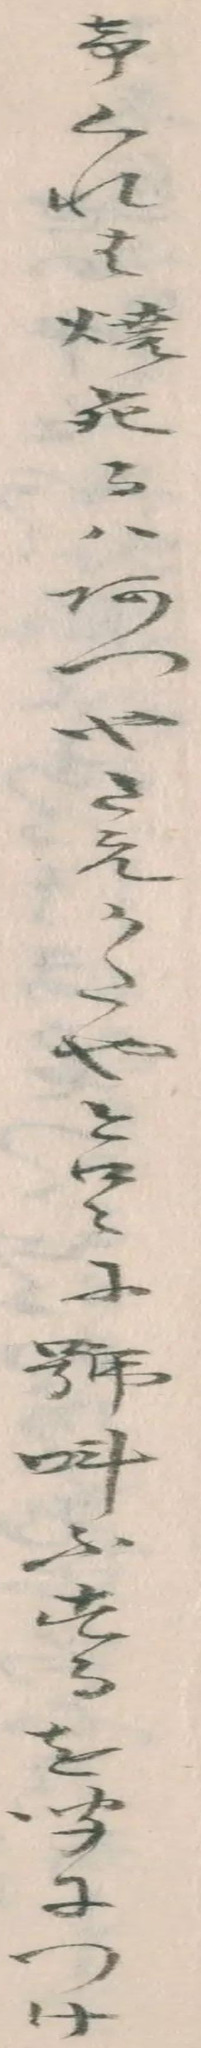てくれは焼死るはあつやたえかたやと口々に号叫ふするを聞につけ
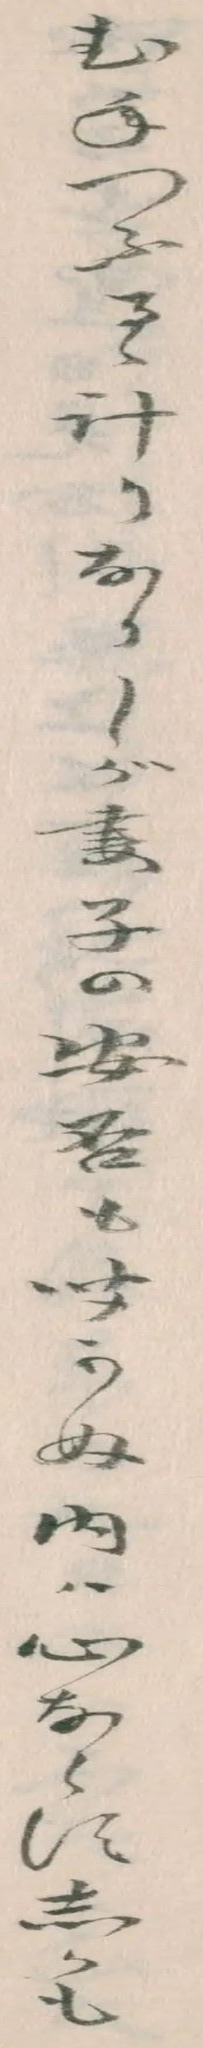むねつぶるゝ計なりしが妻子の安否も聞かぬ内はこころならすしかも
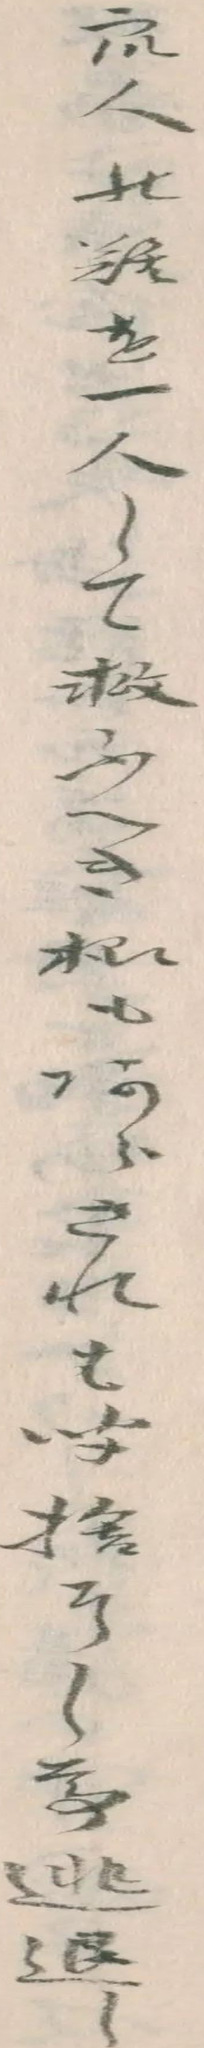衆人の難を一人して救ふへき根もあらされは聞捨にして逃退し
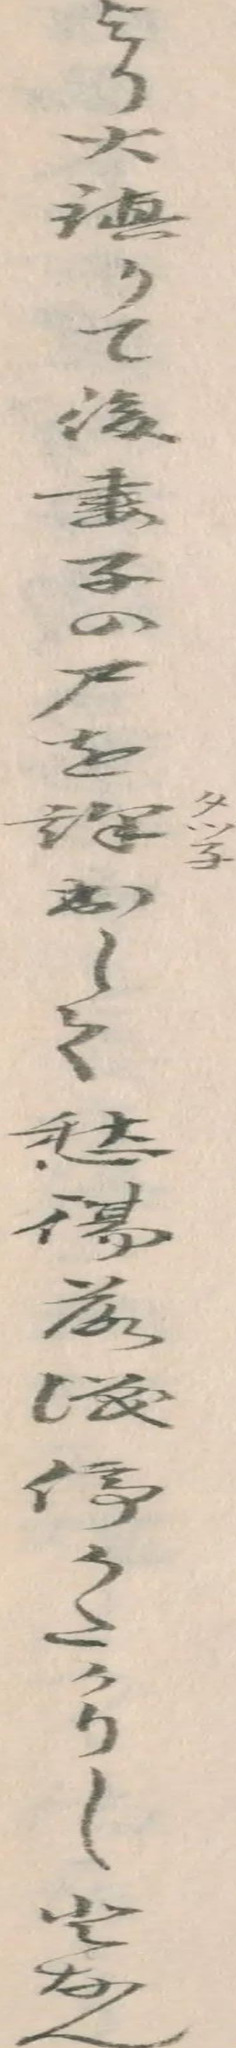より火鎮りて後妻子の屍を繹出して愁傷落涙停かたかりしとなん

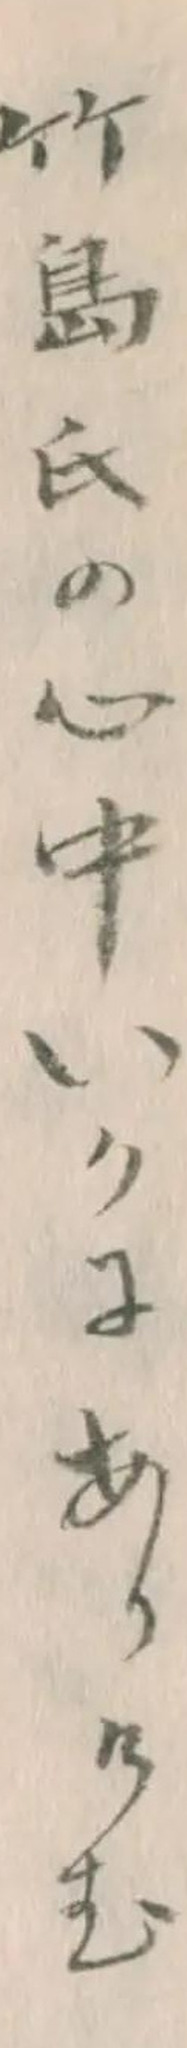竹島氏の心中いかにありけむ
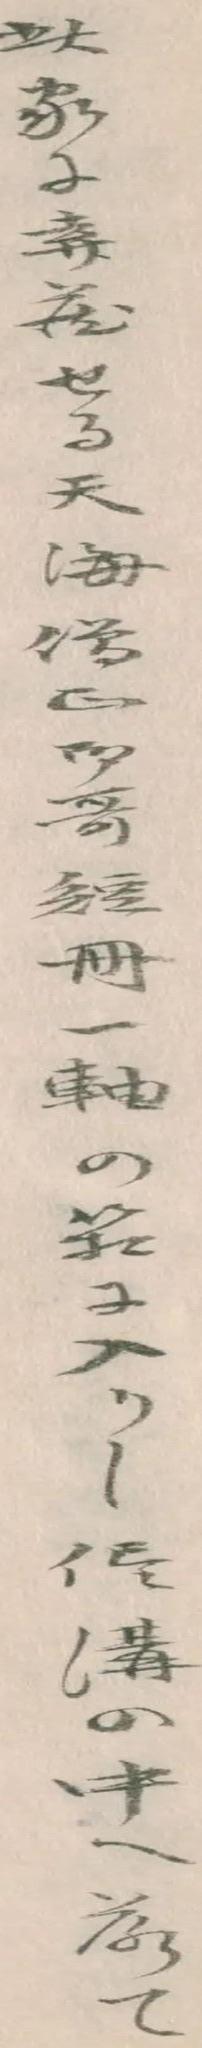此家に弆蔵せる天海僧正御哥短冊一軸の箱に入りし侭溝の中へ落て
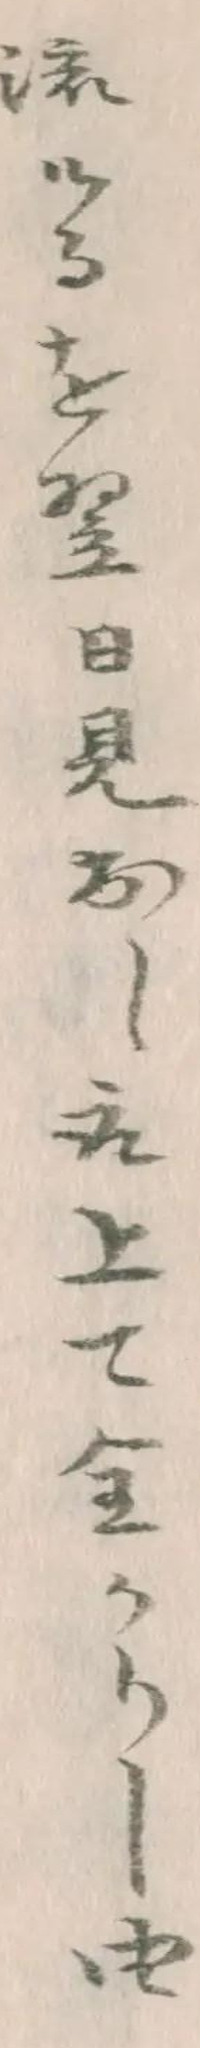流けるを翌日見出し取上て全かりし由
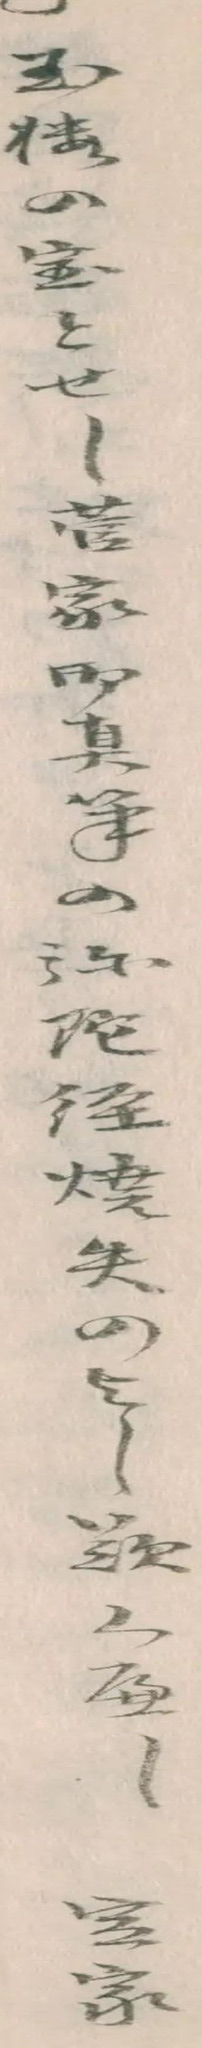〇玉楼の宝とせし菅家御真筆の弥陀経焼失のよし歎くへし定家
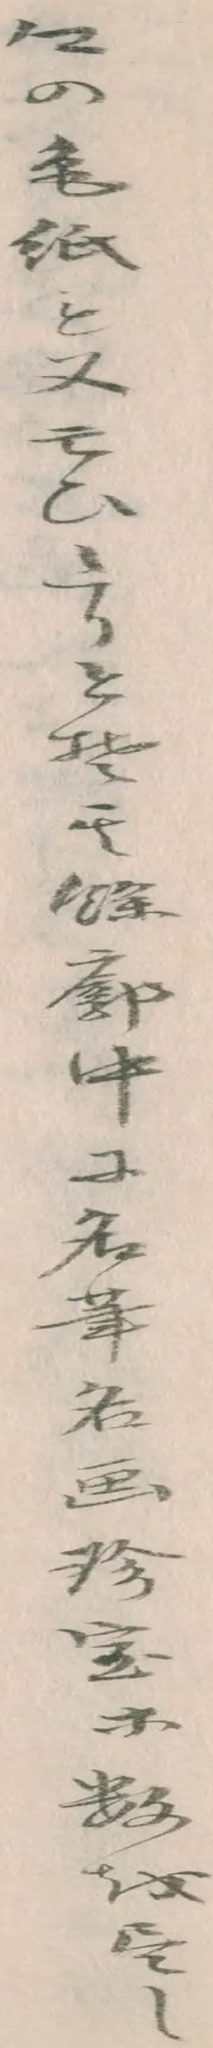卿の色紙も又亡ひたりとそ其余廓中に名筆名画珍宝等数を尽し
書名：地災撮要. 巻10(地震之部) 上,下
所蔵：国立国会図書館 National Diet Library, JAPAN
